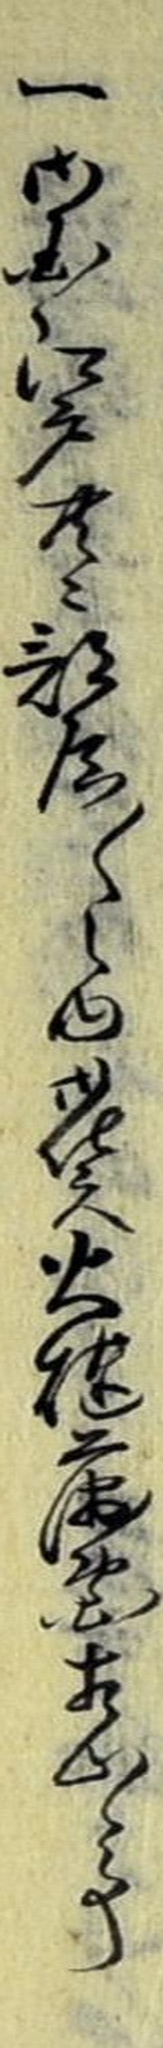一御国江戸共に部屋〳〵之内御貸火燵蒲団相止候事

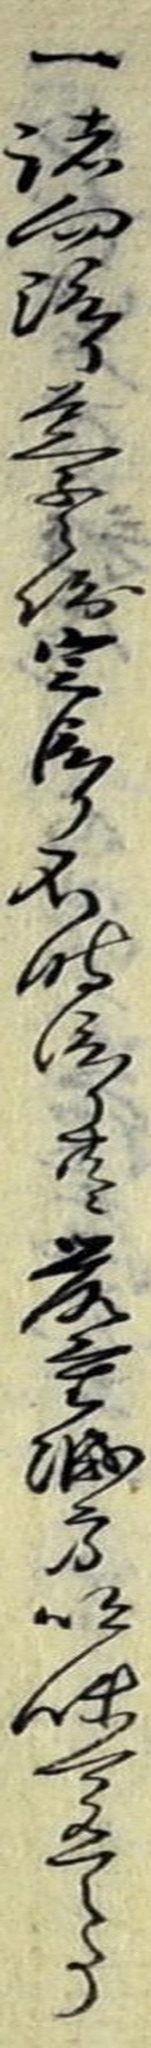一諸向渡り荒子之儀定渡り不時渡り共に厳重減方吟味可有之事
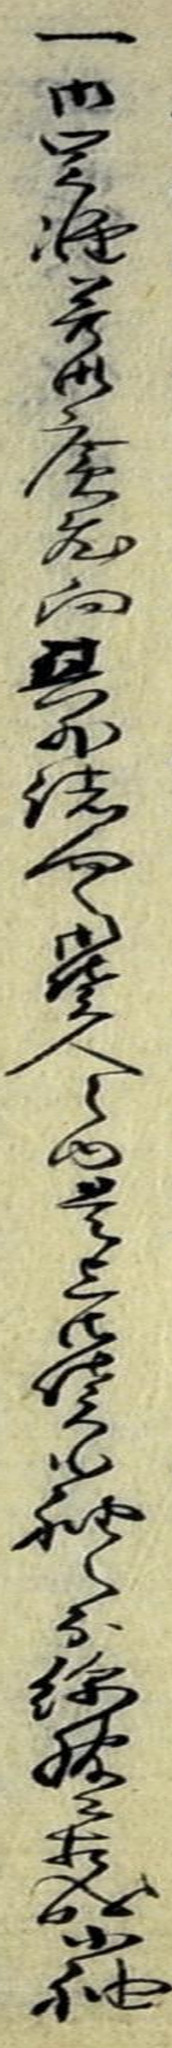一御足軽并御広敷向其外諸向之御貸人之内是迄御貸小袖之分綿服に相成小袖
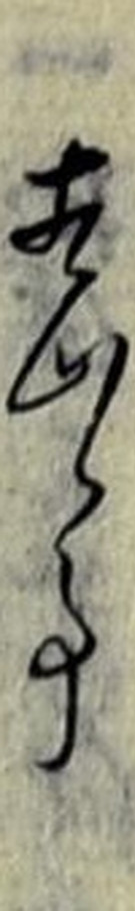相止候事
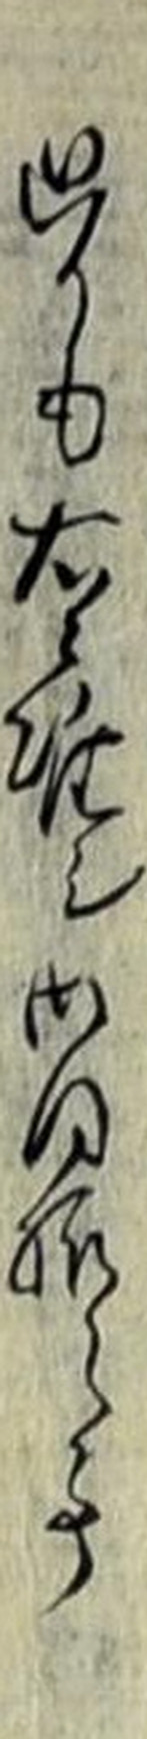廻りも右に准し御同様之事
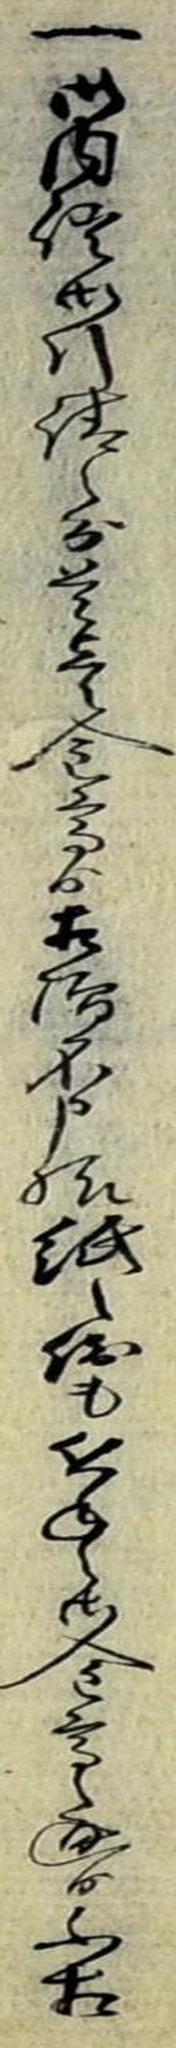一御内証御引請之分是迄之金高ゟ相増不申様紙之儀も近年之御金高之通ゟ不相
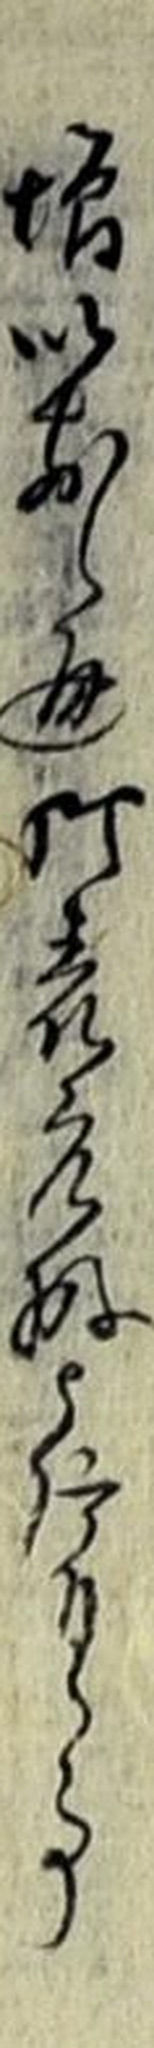増以前之通御表取扱被仰付候事
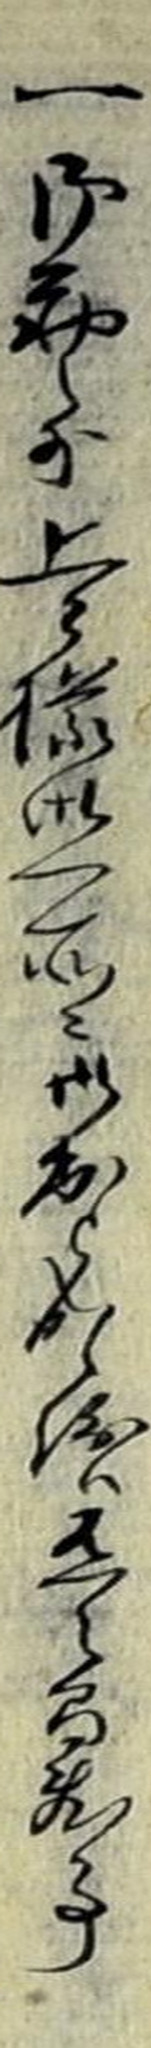一御勤之外上々様御一所に御出被成候儀は有之間敷事
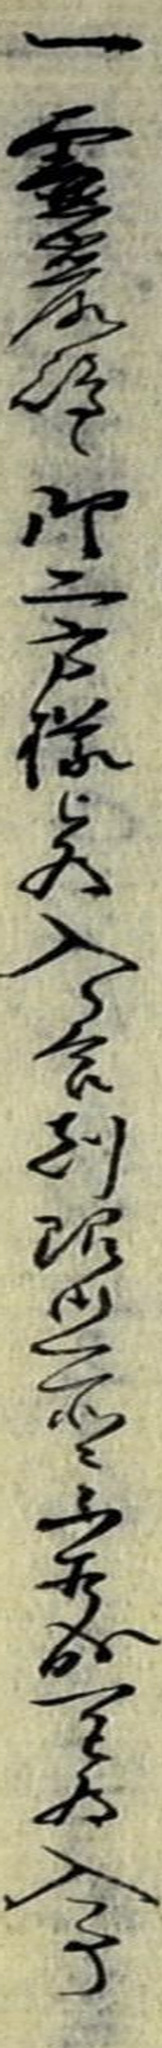一霊岸嶋へ御二方様被為入候節刻限御一所に不相成可被為入事
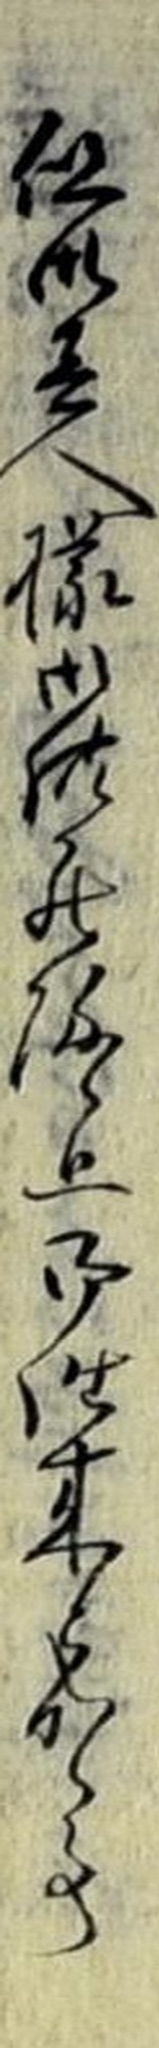但御壱人様御供罷帰候上御往来被成候事
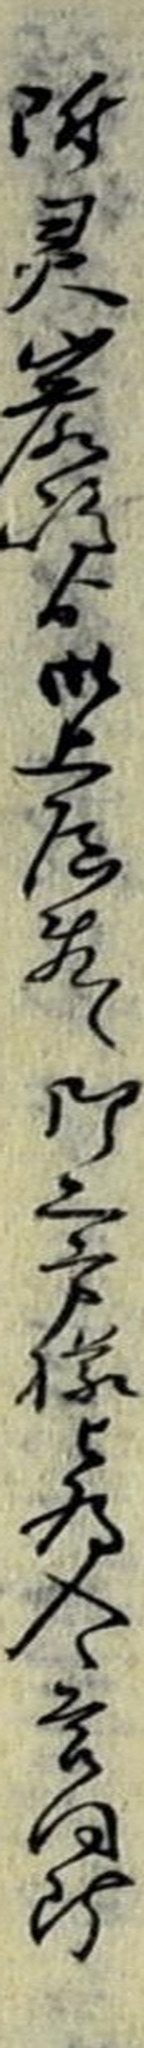附霊岸嶋ゟ御上屋敷へ御二方様被為入候節同断
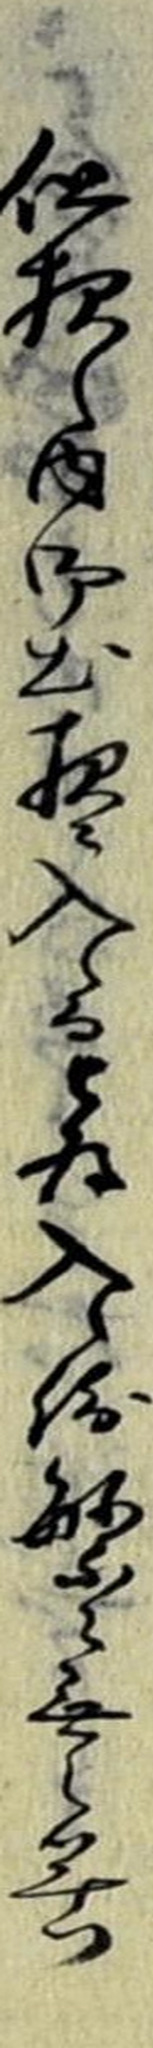但夜之内御出夜に入候而被為入候儀繁々無之筈
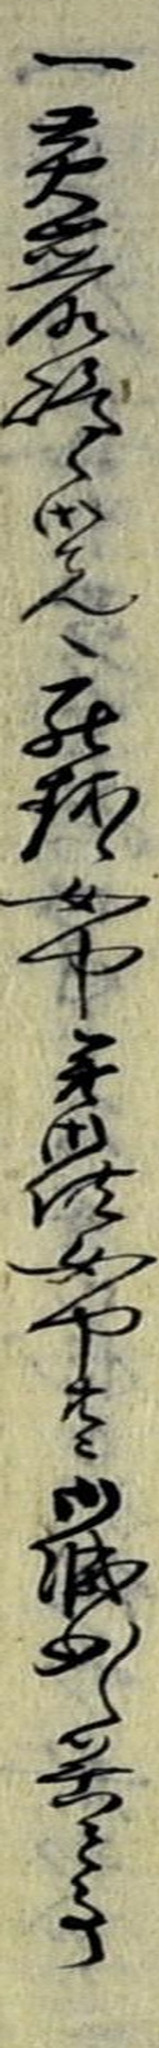一霊岸嶋之御先へ罷越候女中并御供女中共に御減少候筈に候事
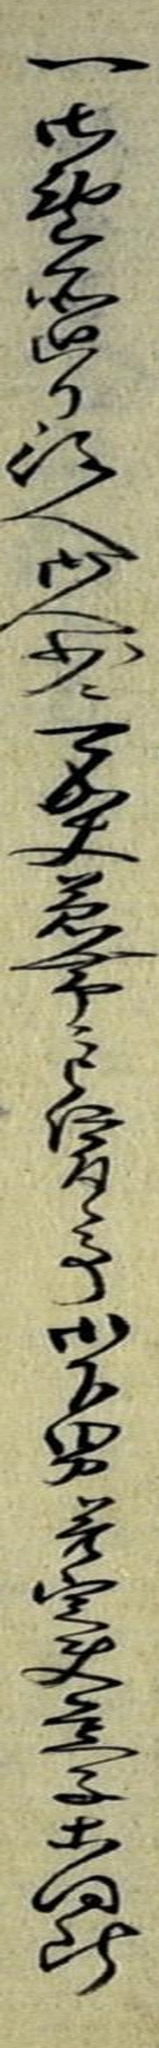一御台所廻り役人御人少に可成丈兼帯に被仰付候事御下男并定夫荒子等同断
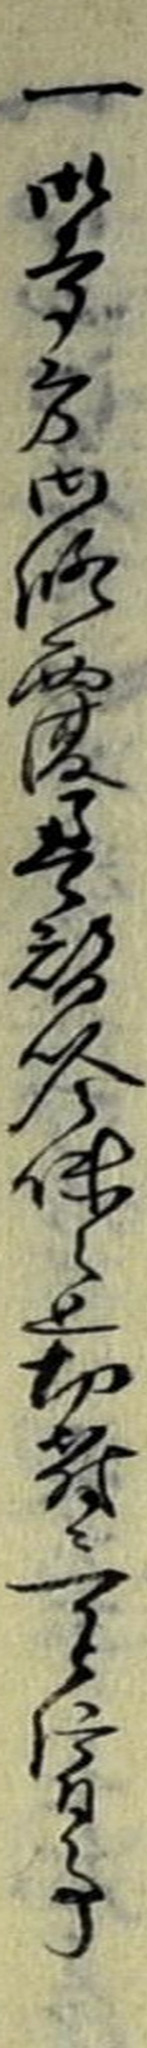一御寺方御修覆畳替吟味之上切符に可被仰付事
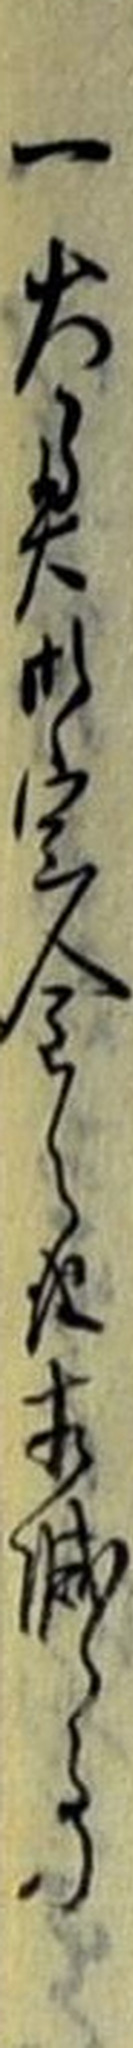一大奥御定金之儀相減候事
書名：命令之部 二
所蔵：福井県文書館 Fukui Prefectural Archives
